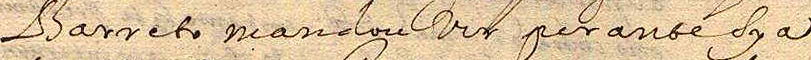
Barreto mandou vir perante sy a
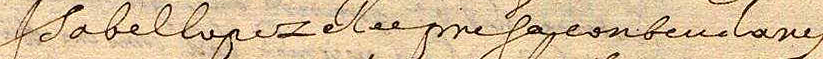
Jsabel lopez Ree presa conteuda nes
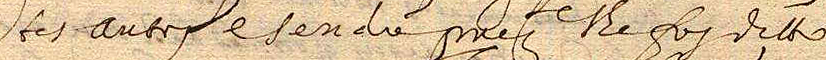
tes autos e sendo prezte lhe foj ditto
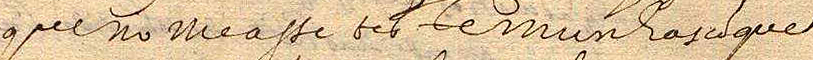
que nomeasse testemunhas cō que
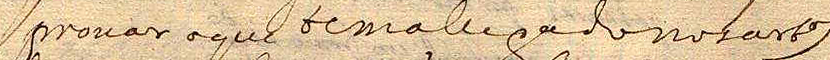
prouar o que tem allegado nos artos
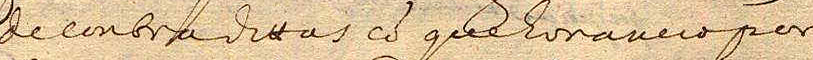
de contradittas cō que hora ueio por
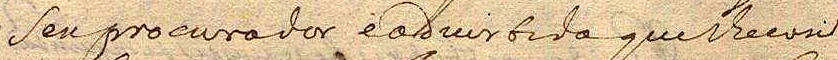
seu procurador e aduirtida que lhe con
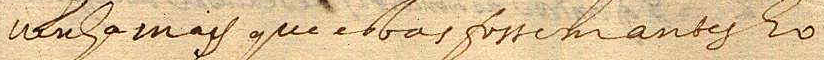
uinha mais que estas fossem antes ho
